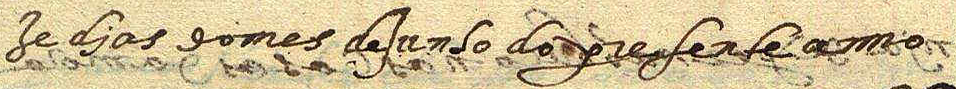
ze djas domes de Junho do presente anno
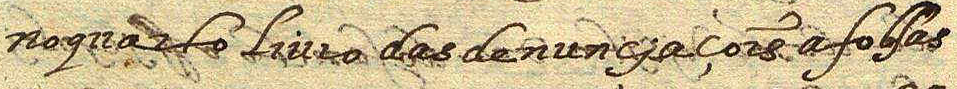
no quarto Livro das denuncjaçois a folhas
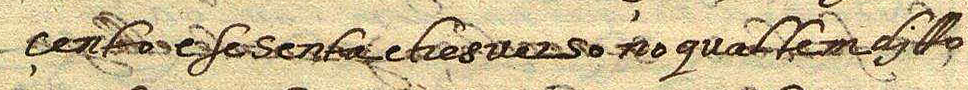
çento e ssenta e três verso no qual tem djtto
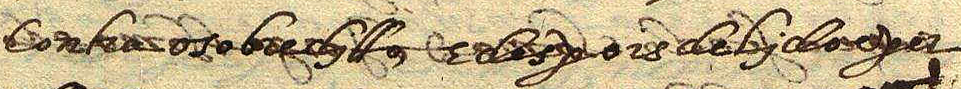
contra osobredjtto, e despois de ljdo per
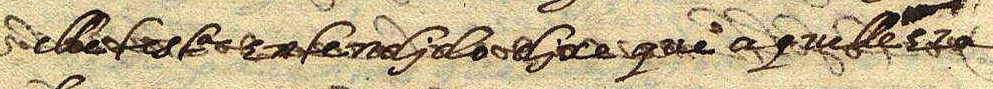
elle test.a entendido dixe que aquelle era
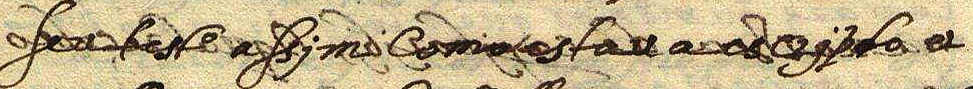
seu test.o assjm como estava escrjto e
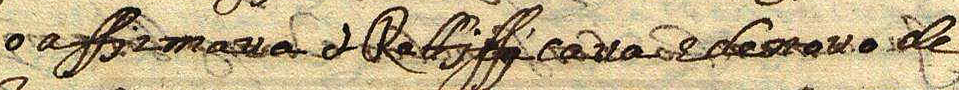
o affirmava e Rattjffjcava e de novo de
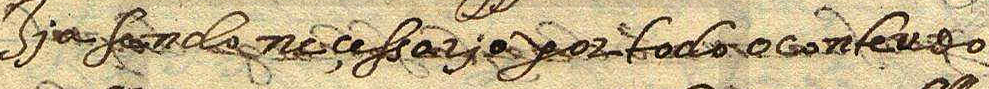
zja sendo neçessario por todo o conteudo
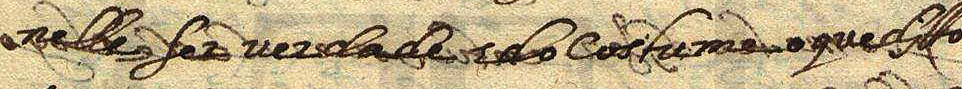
nelle ser verdade e do costume o que djtto
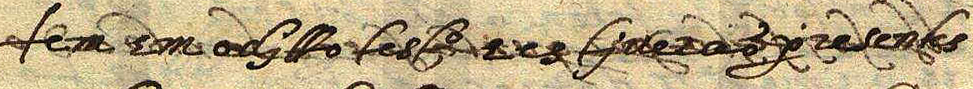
tem em o djtto test.o e estiveraõ presentes
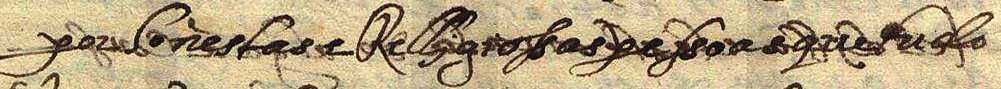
por honestas e Relljgiossas pessoas que tudo
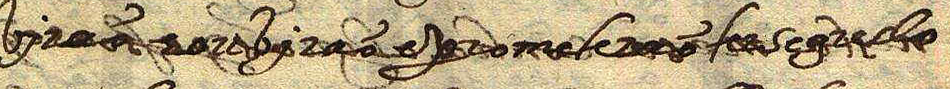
vjraõ e ouvjraõ e prometeraõ ter segredo
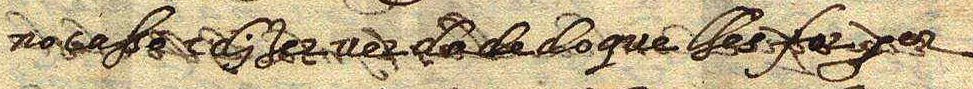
no casso e djzer verdade do que lhes for per
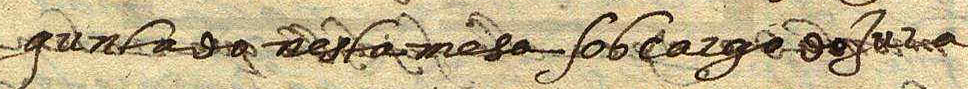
guntado nesta mesa sob cargo do Jura
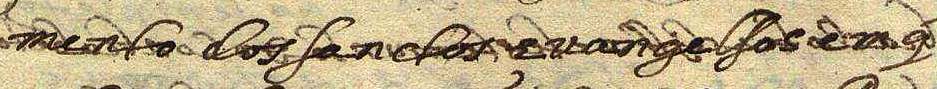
mento dos Sanctos evangelhos em q̄
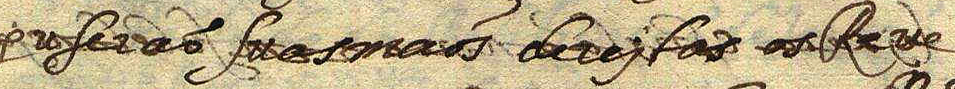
puseeraõ suas mãos derejtas os Reve
